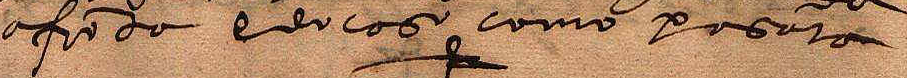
afrōta e do caso como pasara
